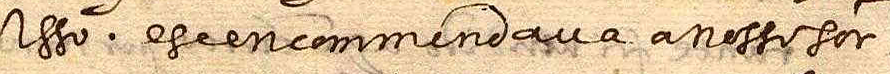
isso. e se encommendaua a nosso sōr
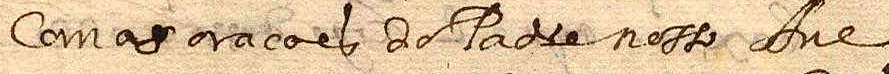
com as oraçoẽs do Padre nosso Aue
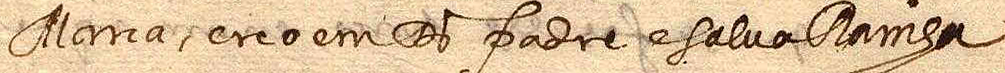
Maria, creo em Ds̄ padre e Salua Rainha
